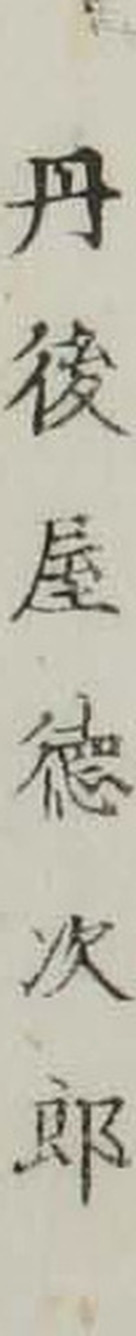丹後屋徳次郎
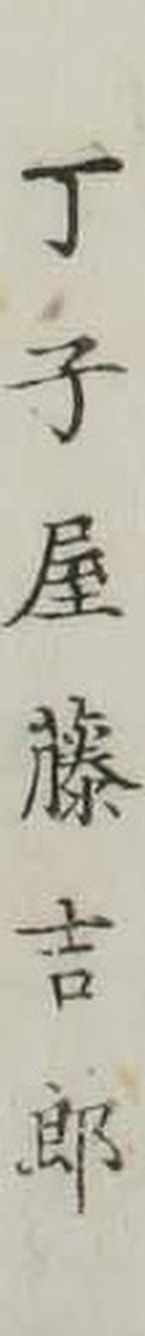丁子屋藤吉郎
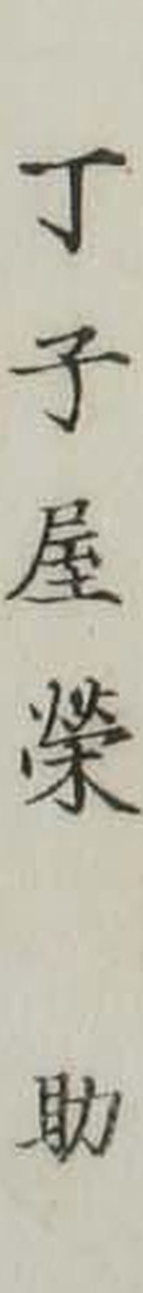丁子屋榮助
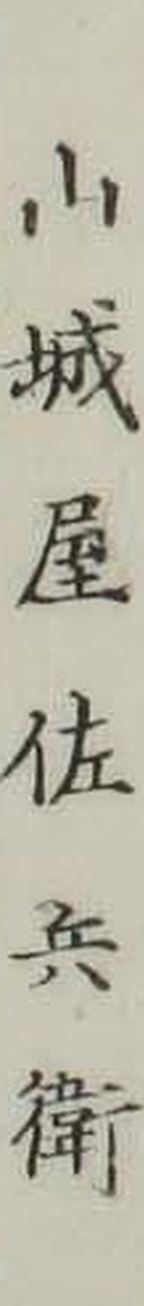山城屋佐兵衛

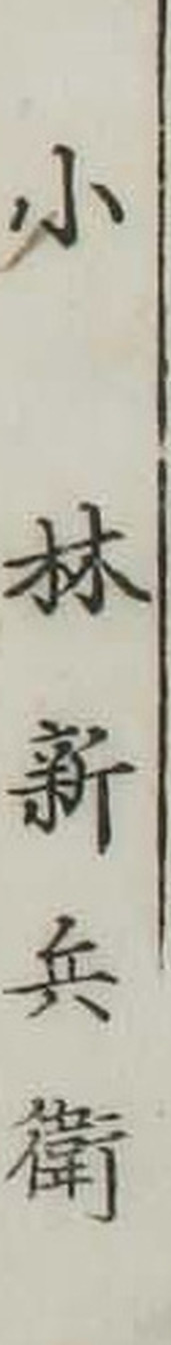小林新兵衛
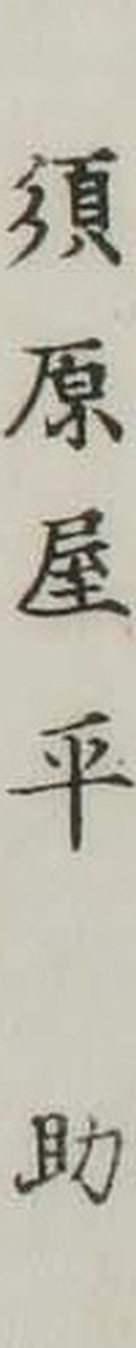須原屋平助
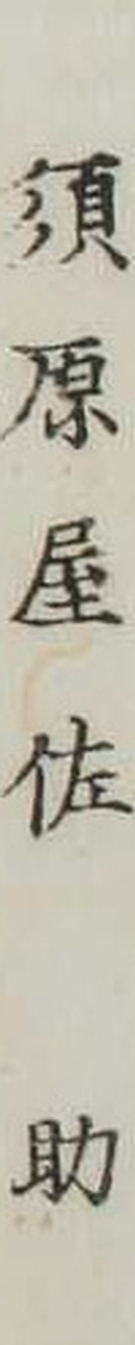須原屋佐助
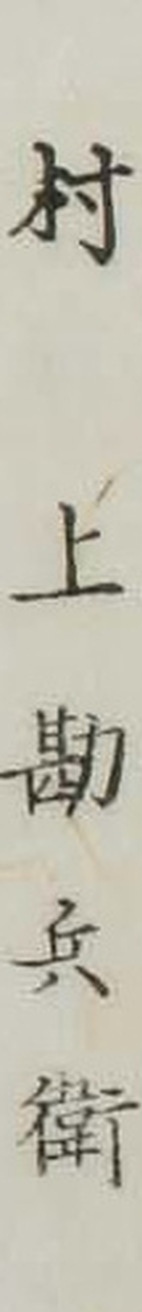村上勘兵衛
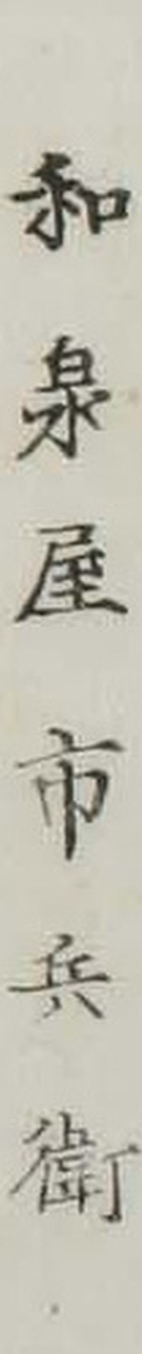和泉屋市兵衛
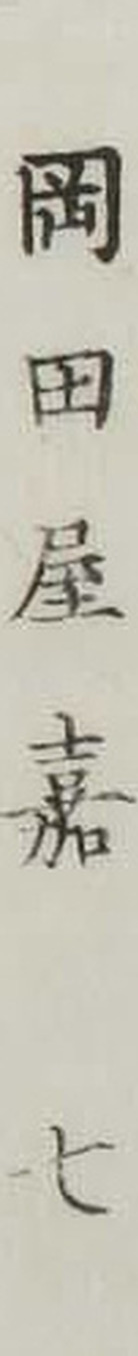岡田屋嘉七
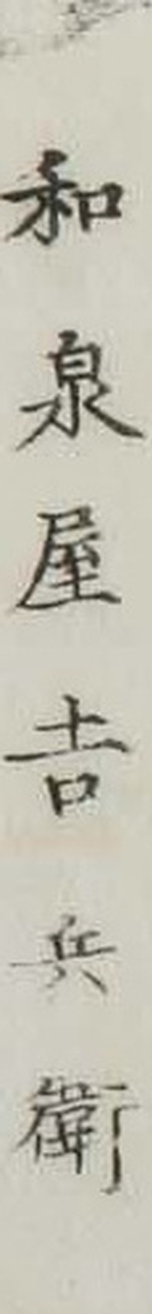和泉屋吉兵衛
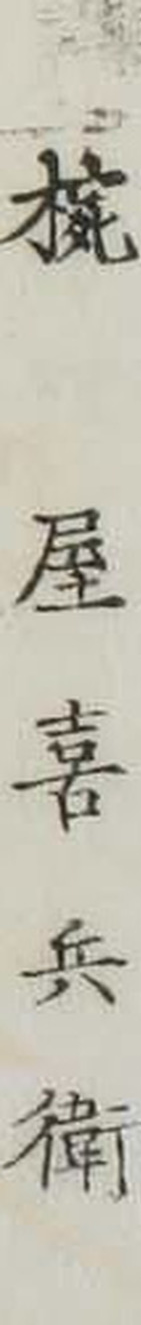椀屋喜兵衛
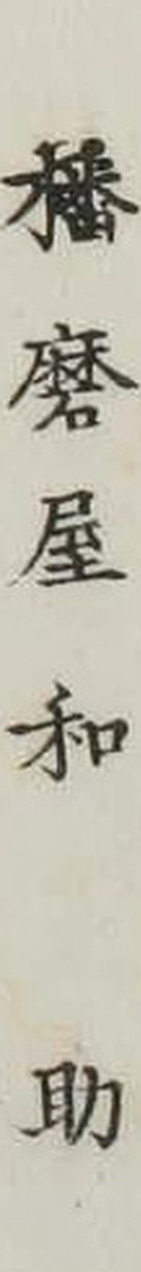播磨屋和助
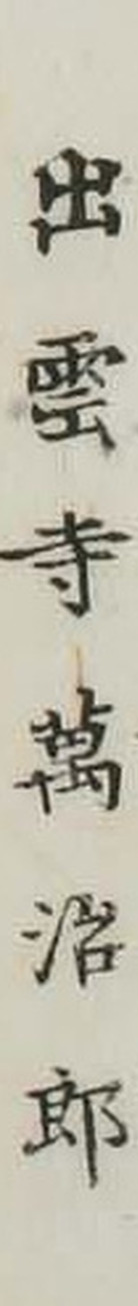出雲寺萬治郎
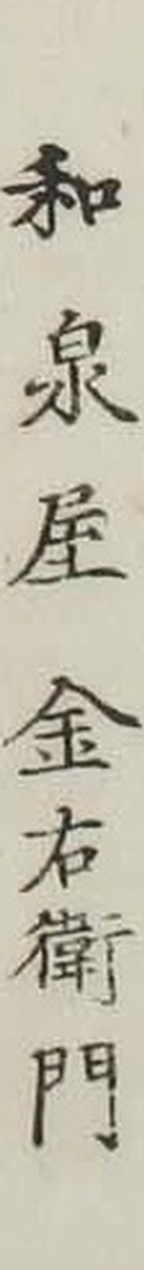和泉屋金右衛門
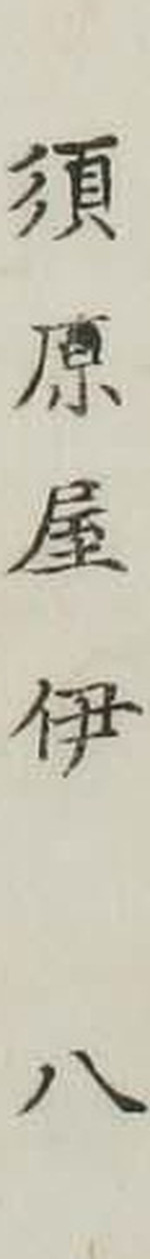須原屋伊八
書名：開化往来
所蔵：東京学芸大学教育コンテンツアーカイブ
